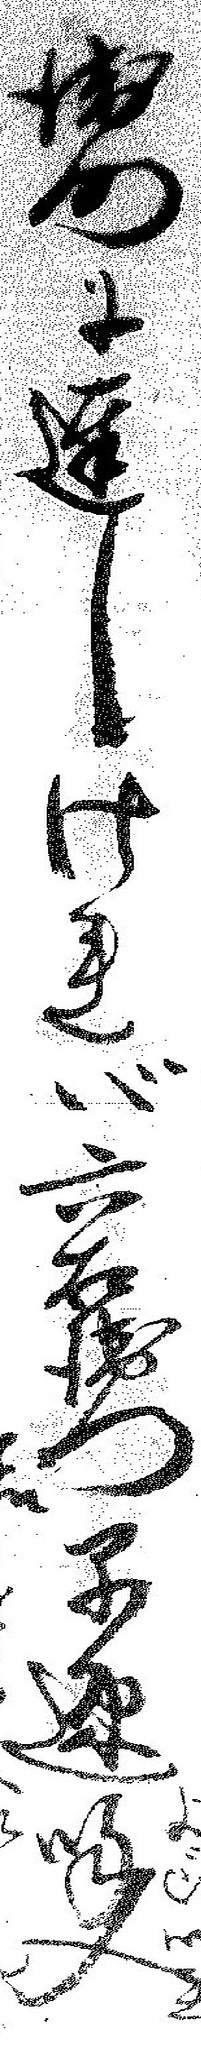衛門に達しければ六右衛門早速呼入
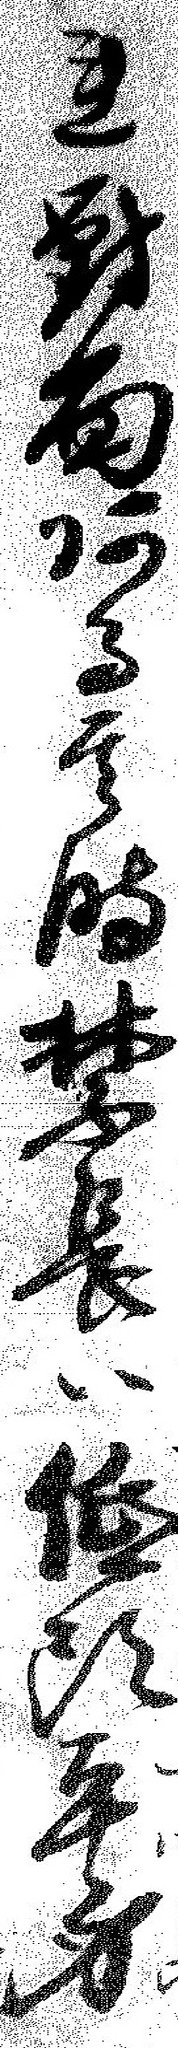れ対面ある其時禁長は低頭平身
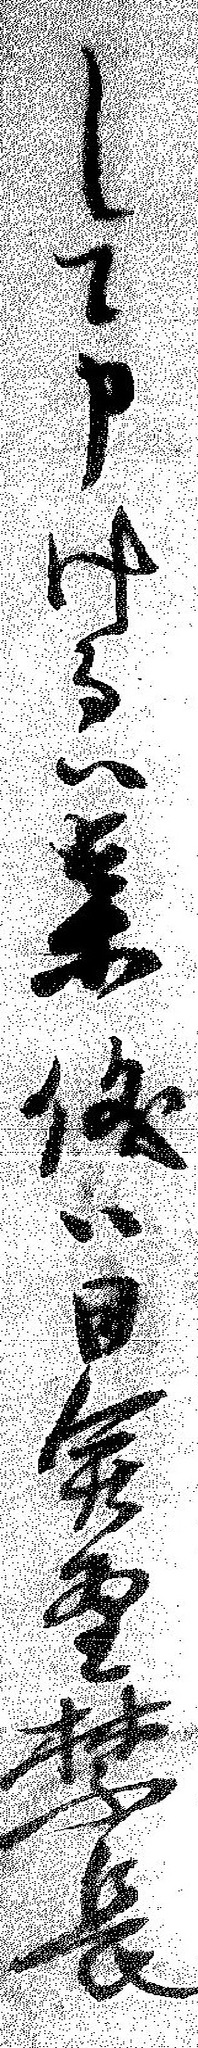して申けるは某儀は日開野禁長

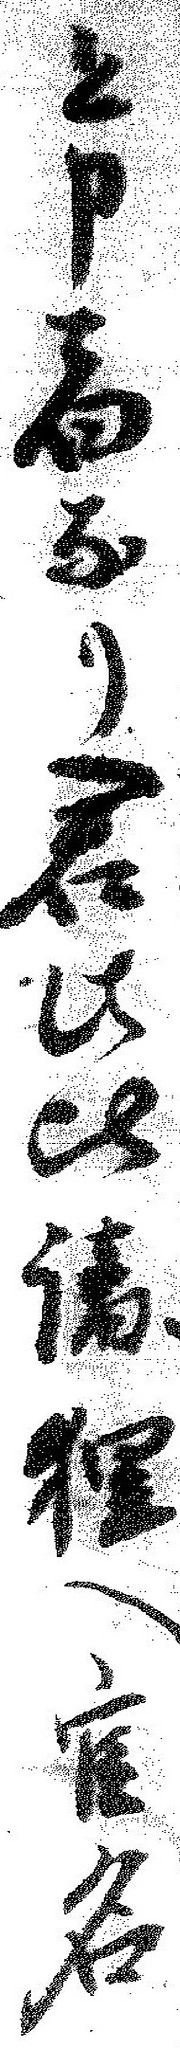と申者なり君此頃諸狸へ官名
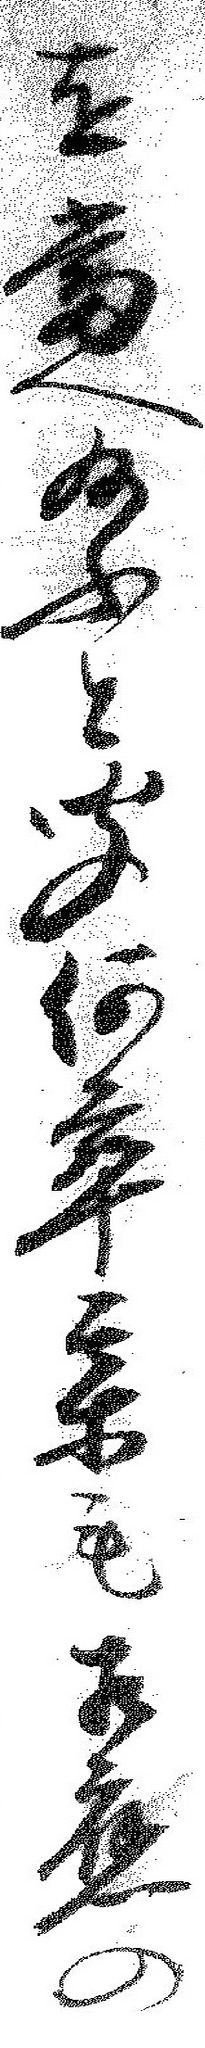を当へ給ふと聞何卒某も相応の
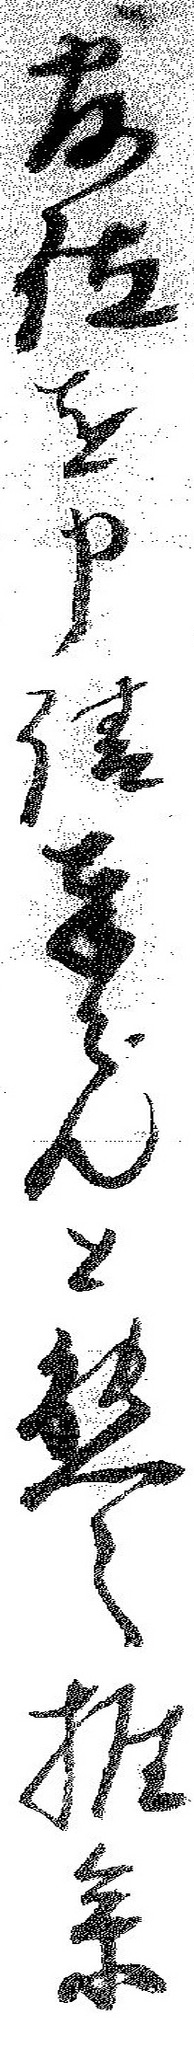官位を申請奉らんと態々推参
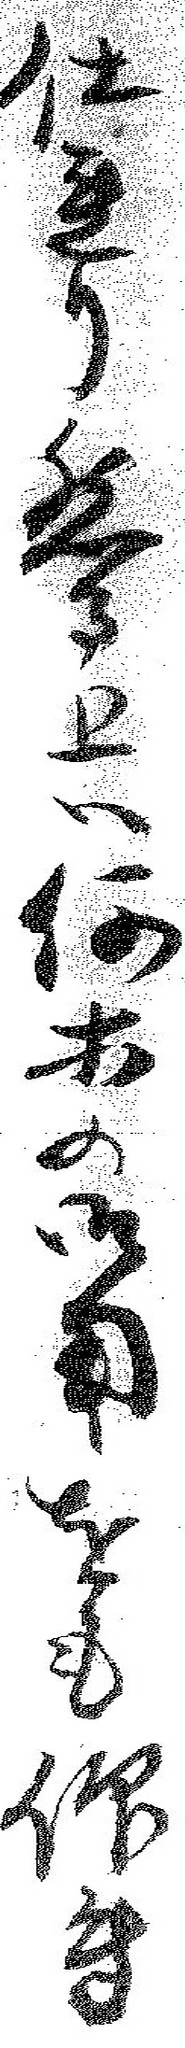仕れり然る上は何等の御用をも仰付
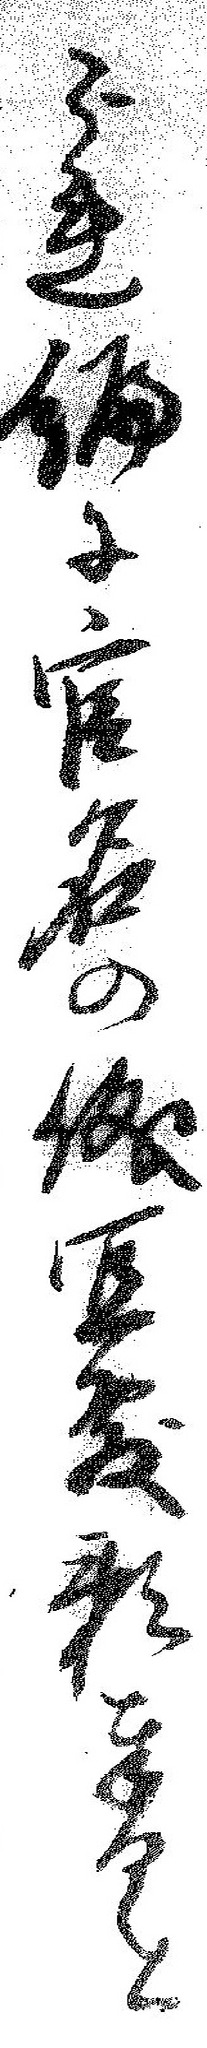られ偏に官名の儀宜敷願奉ると
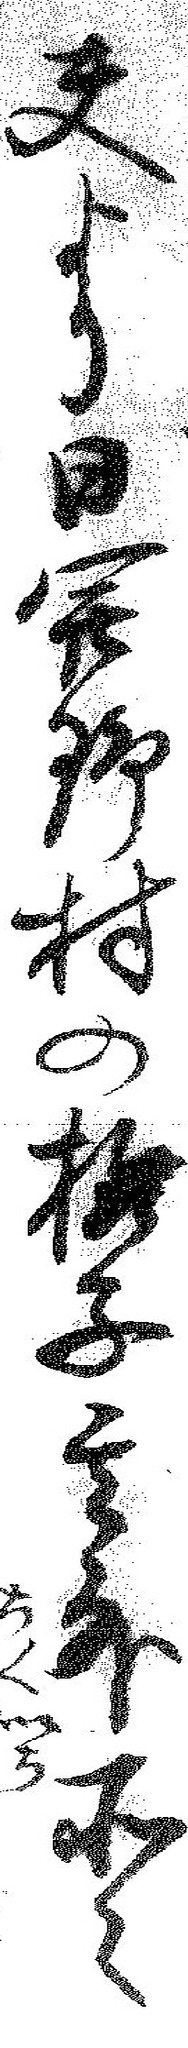夫より日開野村の様子其外所々
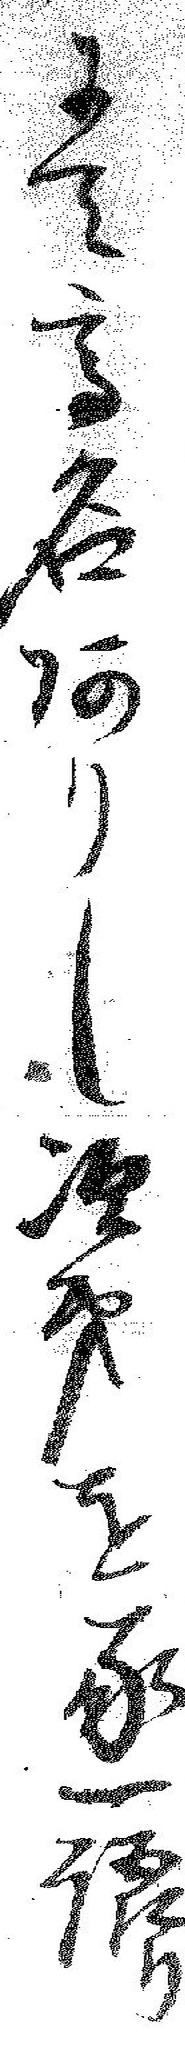にて高名ありし次第を逐一語り
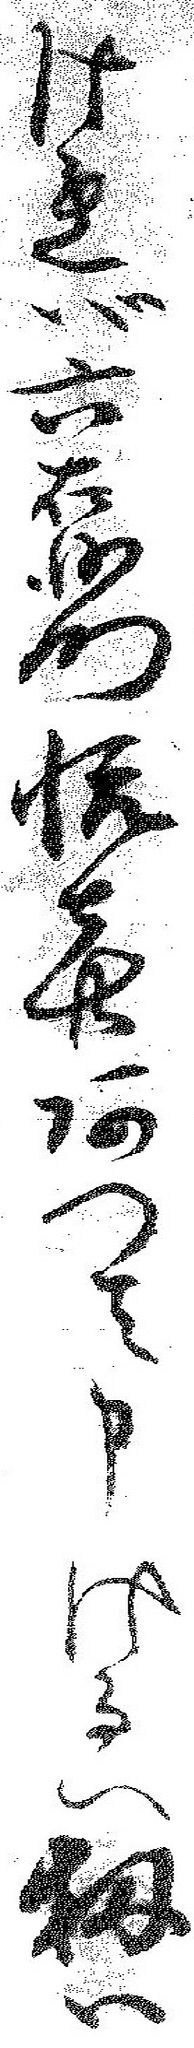ければ六右衛門悦喜あつて申けるは扨は
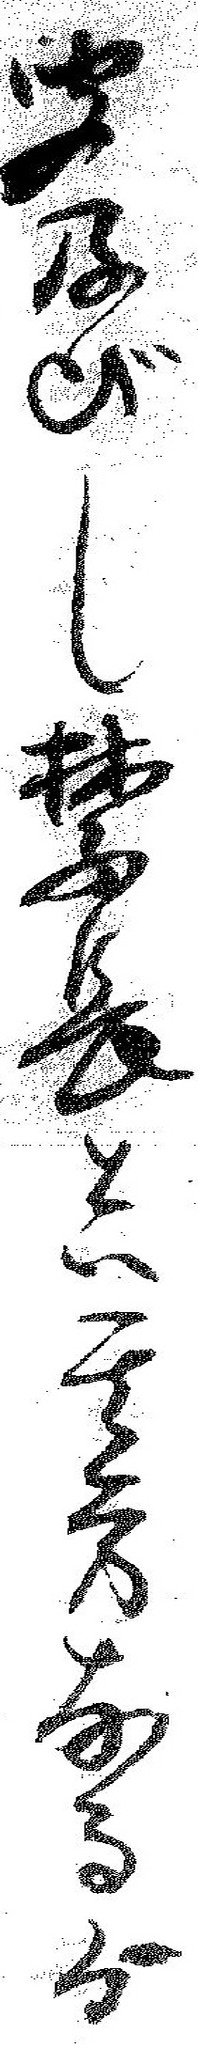聞及びし禁長とは其方なるが
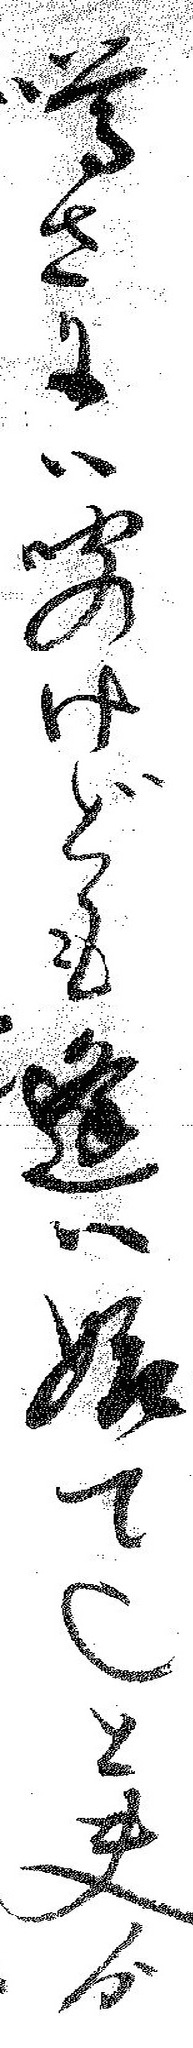噂さには聞けども逢は始て也と夫より
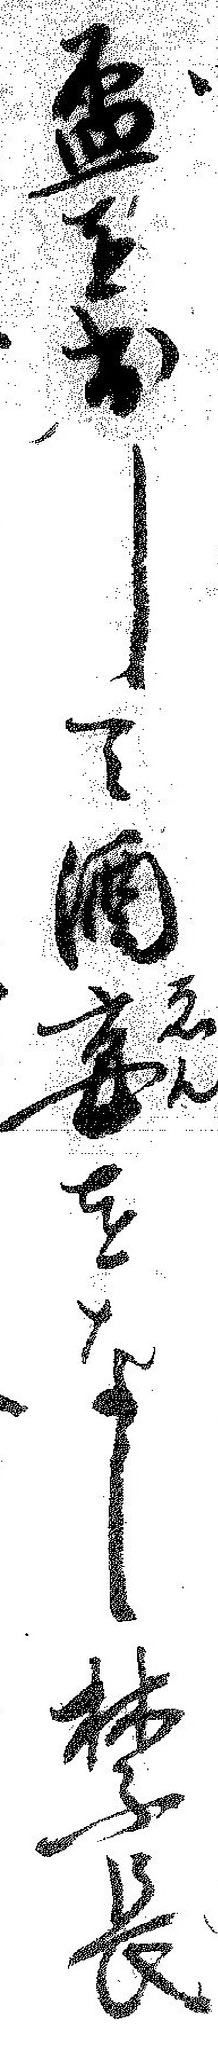盃を出して酒宴をなし禁長
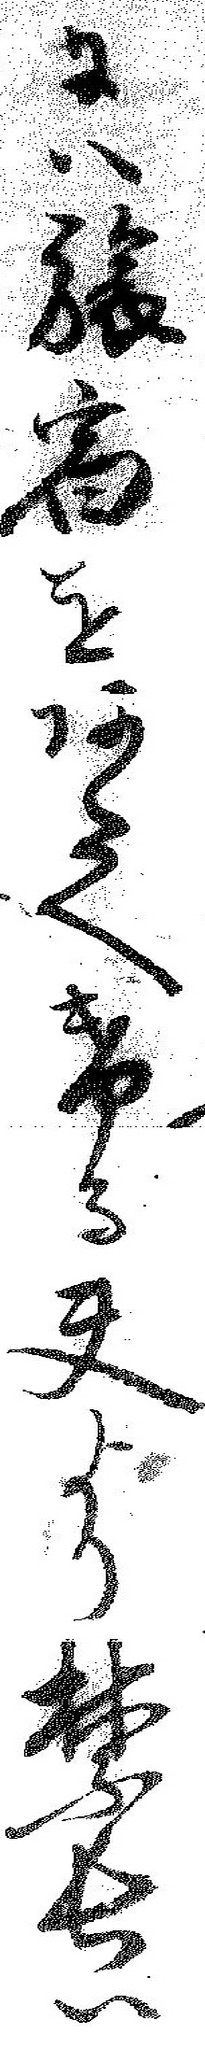には旅宿をあたへける夫より禁長は
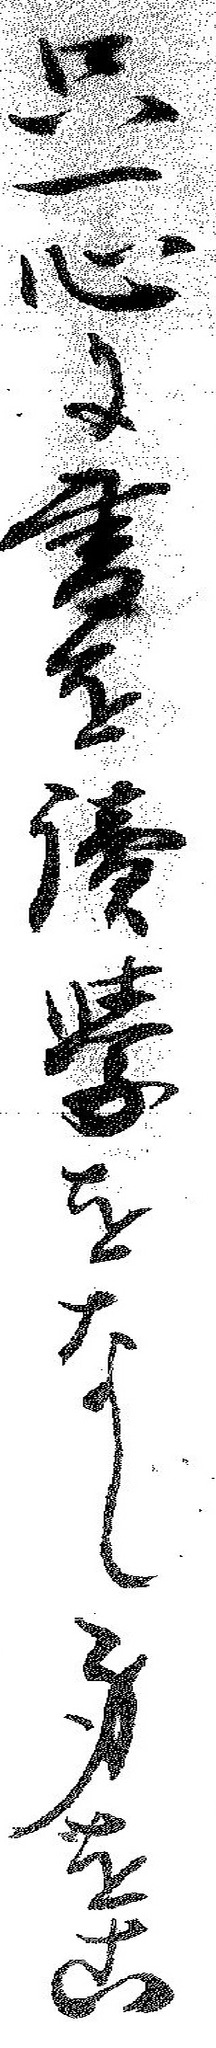只一心に書を読学をなし身をこ
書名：近頃古狸珍説　礼義智信
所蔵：徳島県立図書館
